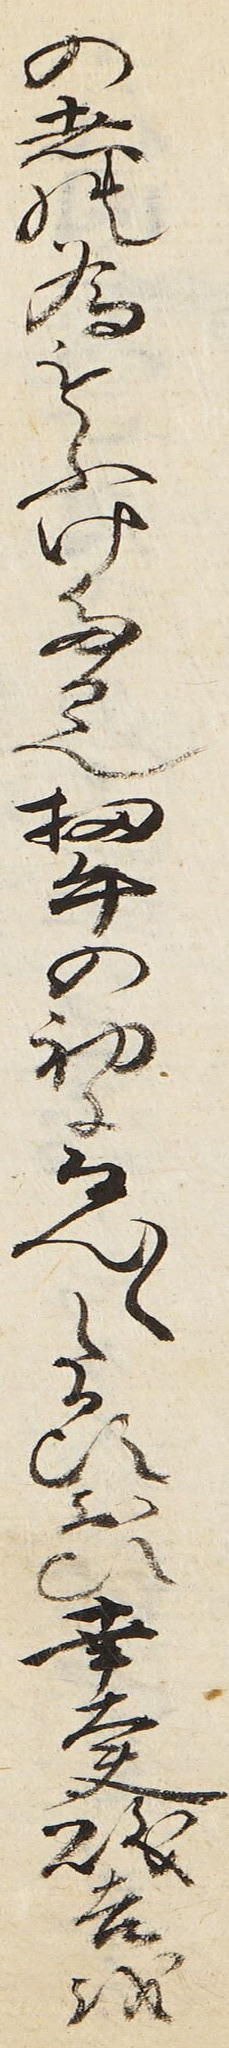の者の為もふけたる也扨午の初になん〳〵たる頃おひ幸太夫磯吉を
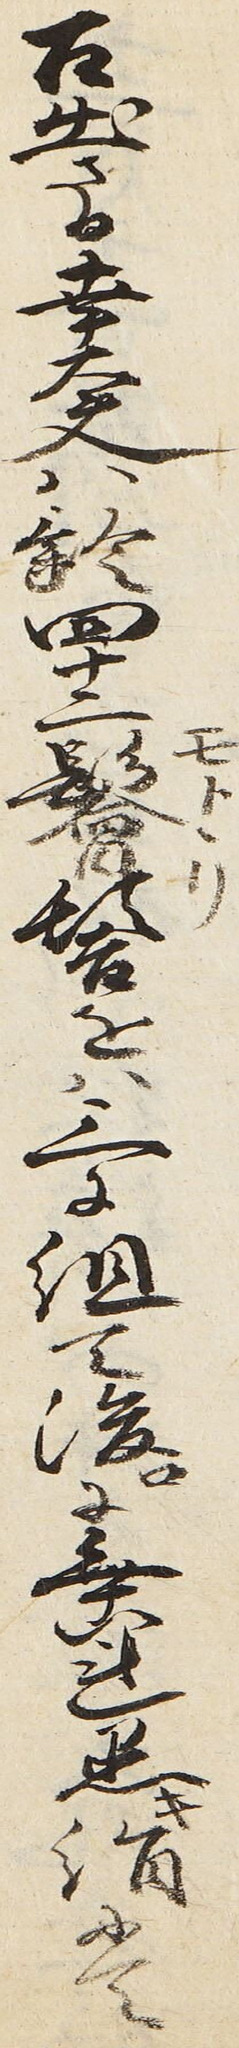召出さる幸太夫は齢四十二鬠髻をは三に組て後ろに垂れ黒き絹にて
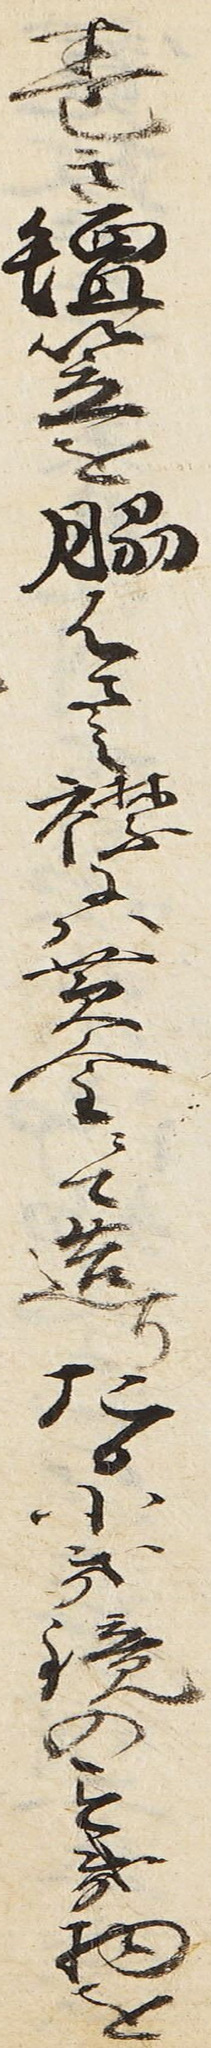巻き氊笠を脇はさみ襟には黄金にて造りたる小き鏡のことき物を
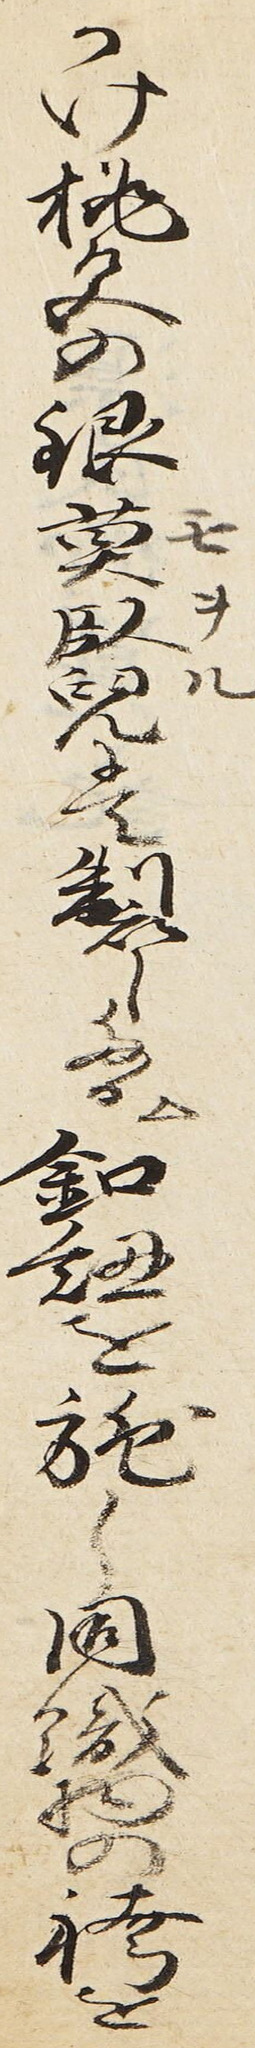かけ桃色の銀莫臥児にて製したる釦紐を施し同織物の袴を
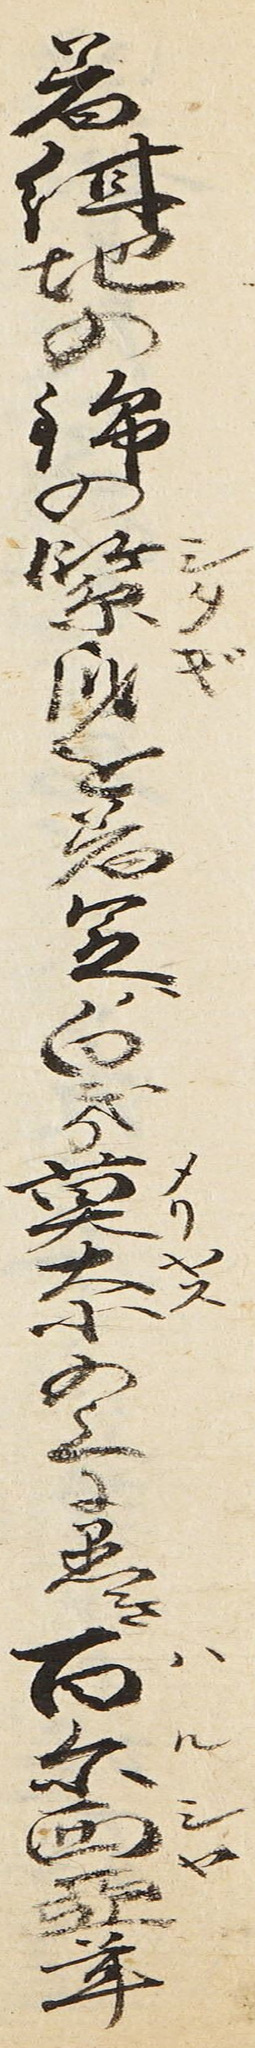着紺地の錦の緊身を着足は白き莫大小の上に黒き百尓西亜革
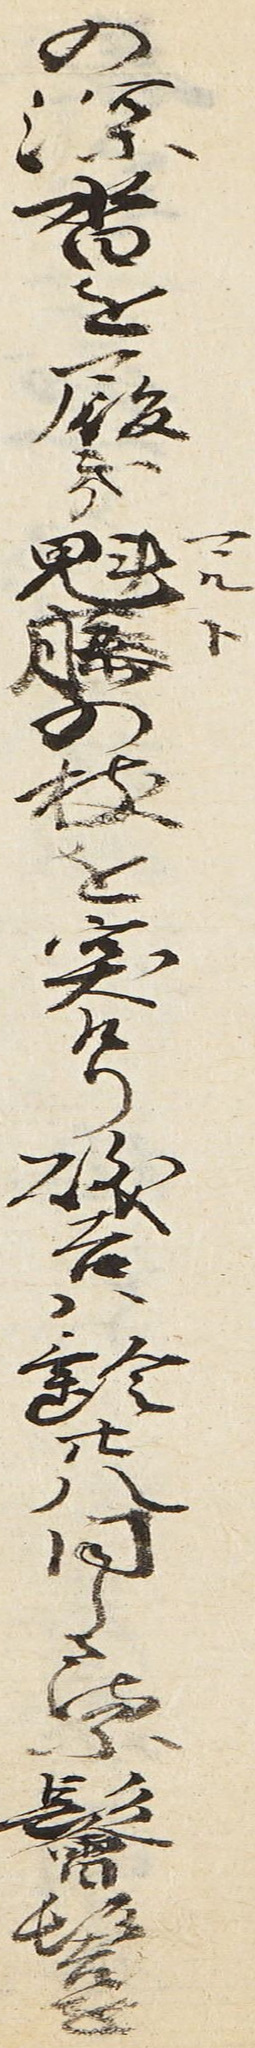の深沓を履き魁藤の杖を突けり磯吉は齢廿八同しさまに鬠髻を
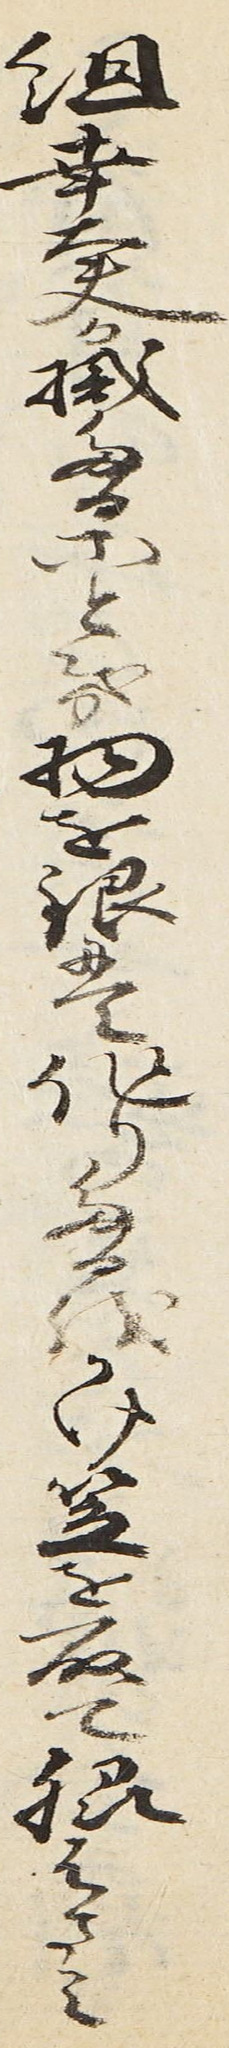組幸太夫か掛たることき物を銀にて作りたるをかけ笠を取て脇はさみ
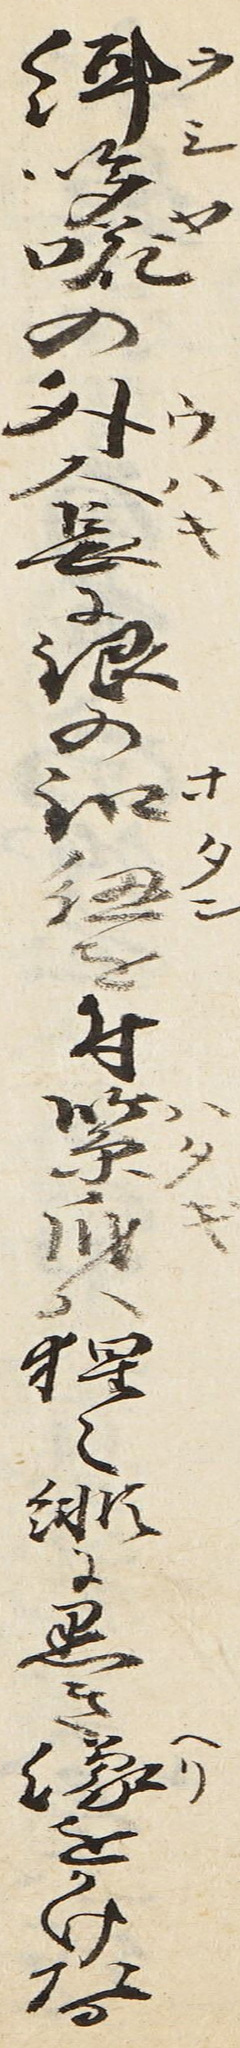絨哆呢の外套に銀の釦紐を付緊身は猩々緋に黒き縁をかけたる
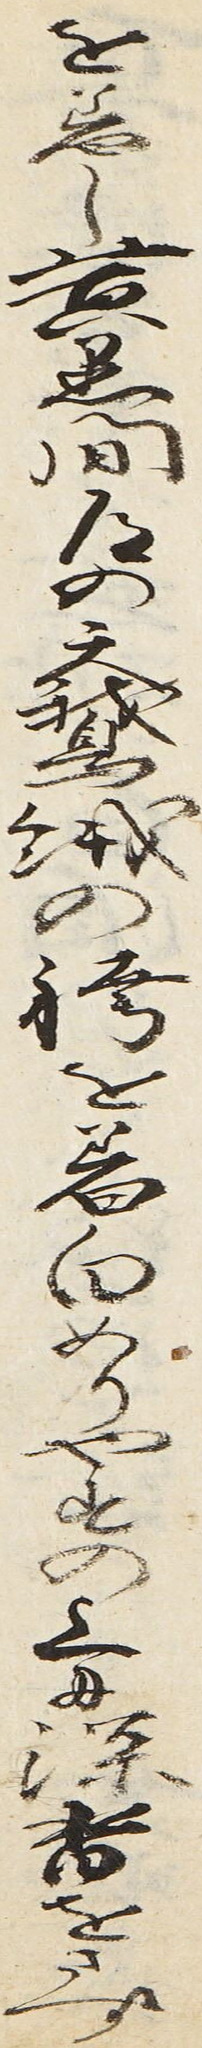を着し黄黒間道の天鵞絨の袴を着白めりやすの上に深沓をさす
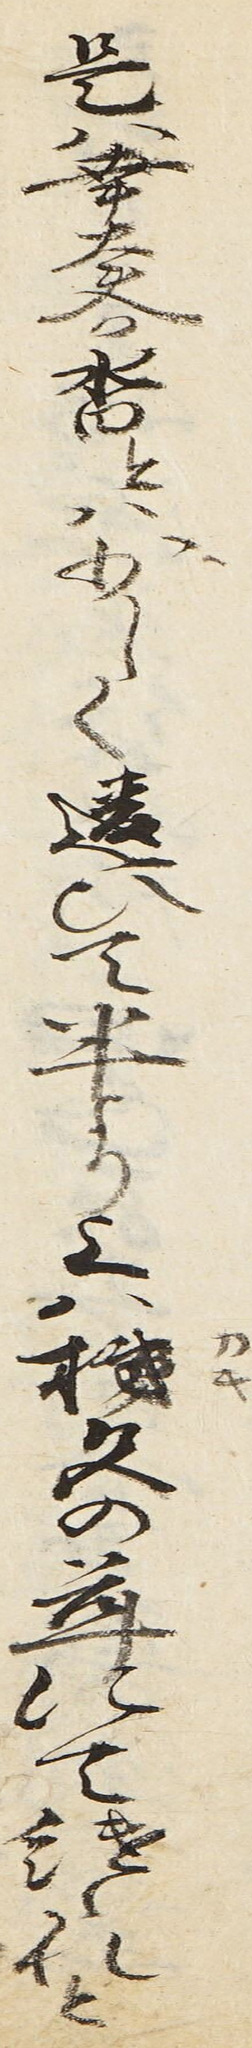是は幸太夫か沓とは少しく違ひて半より上は柿色の革にて継たれと
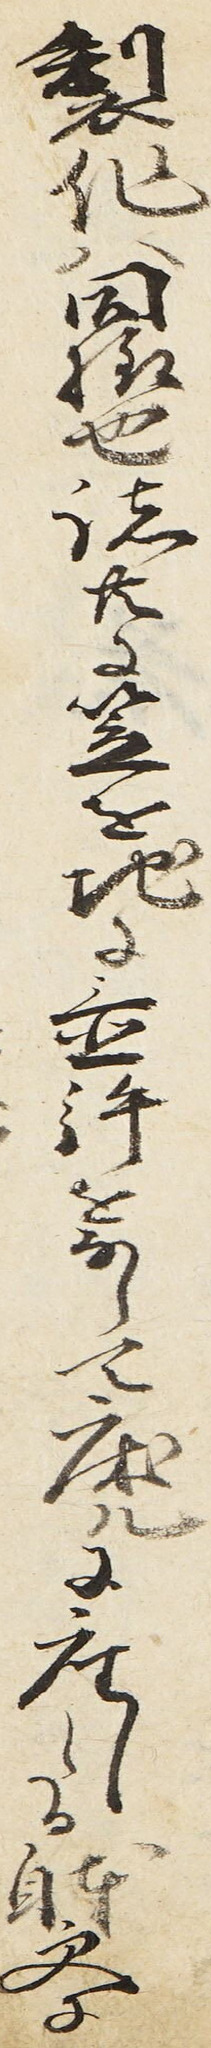製作は同様也諸共に笠を地に置許をなして床几に座したる躰更に
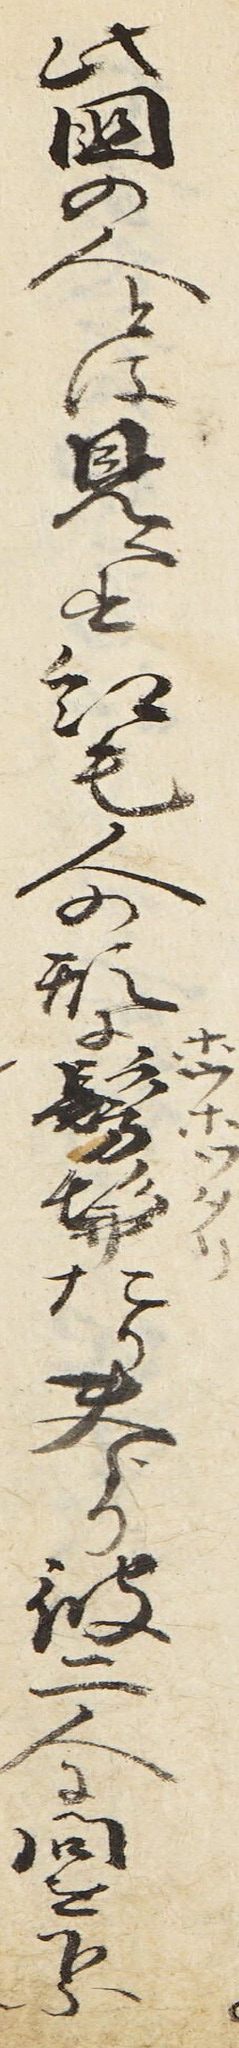此国の人とは見へす紅毛人の形に髣髴たり夫より彼二人に問を下ふ
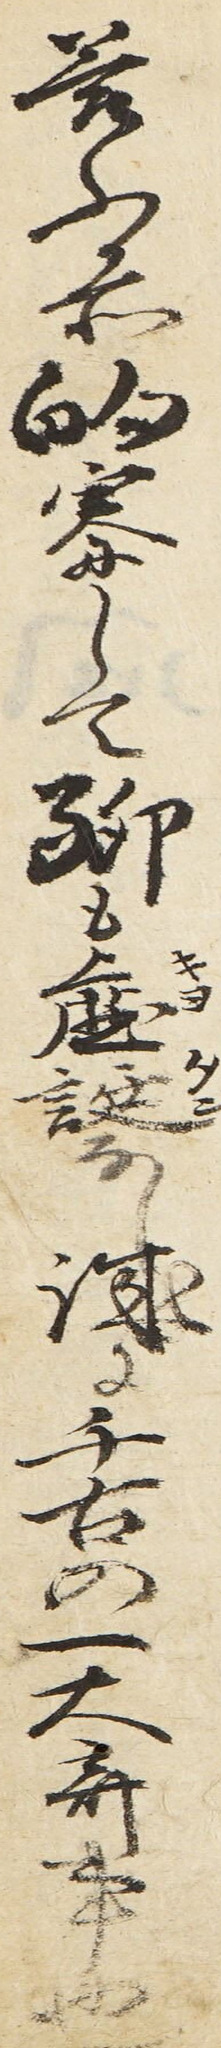答ふる所的実にして聊も虚誕なし誠に千古の一大奇事也

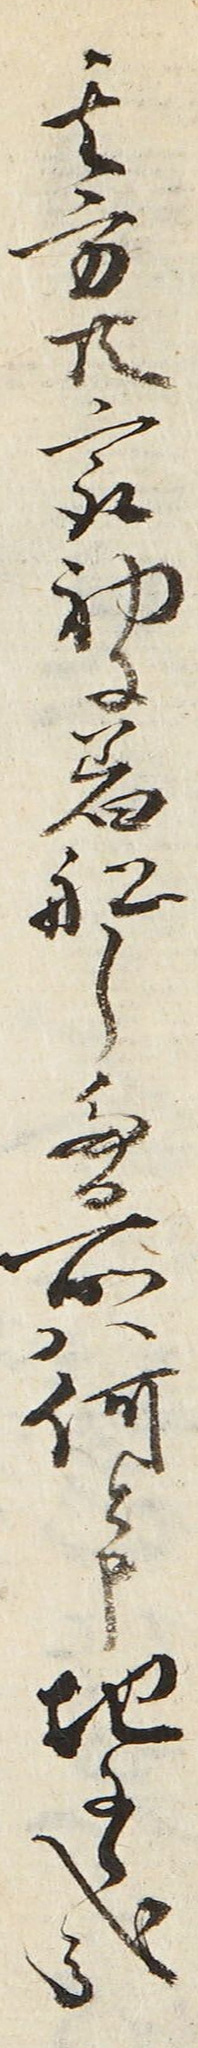其方共最初に着船したる所は何と申地に候哉
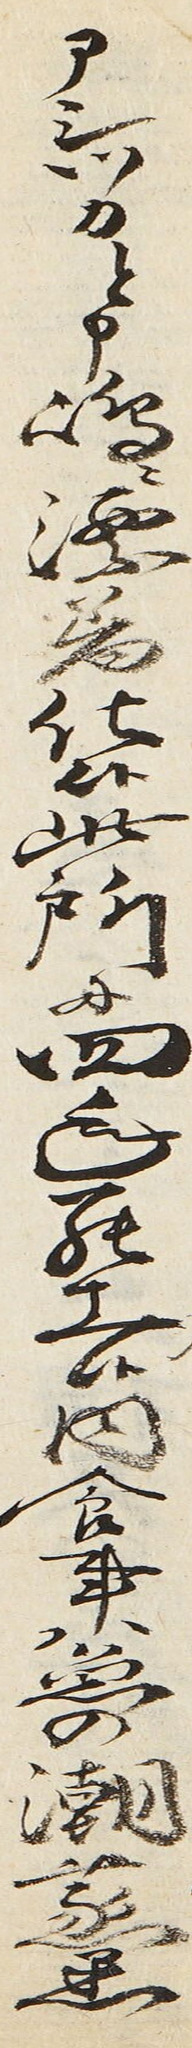アシツカと島に漂着仕候此所に四年罷土候内食事は魚の潮蒸黒
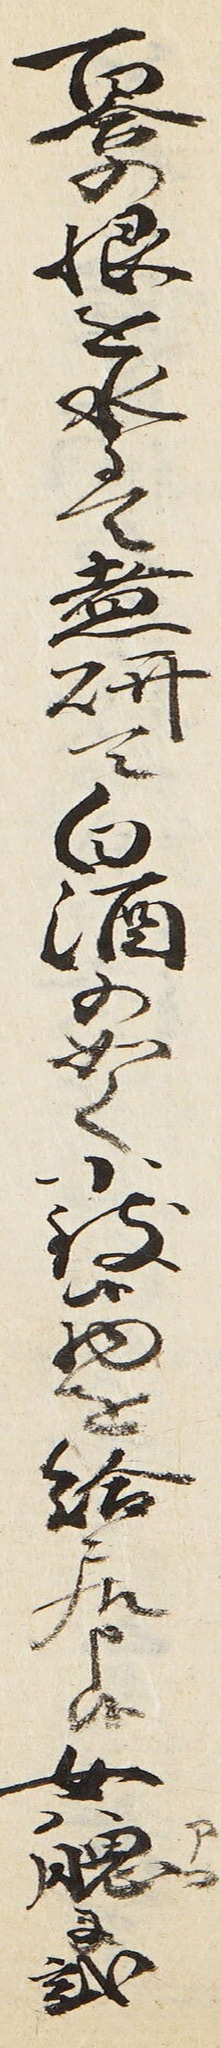百合の根を水にて煮研て白酒の如くに致候物を給居申候女は腮に弐
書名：漂民御覧之記
